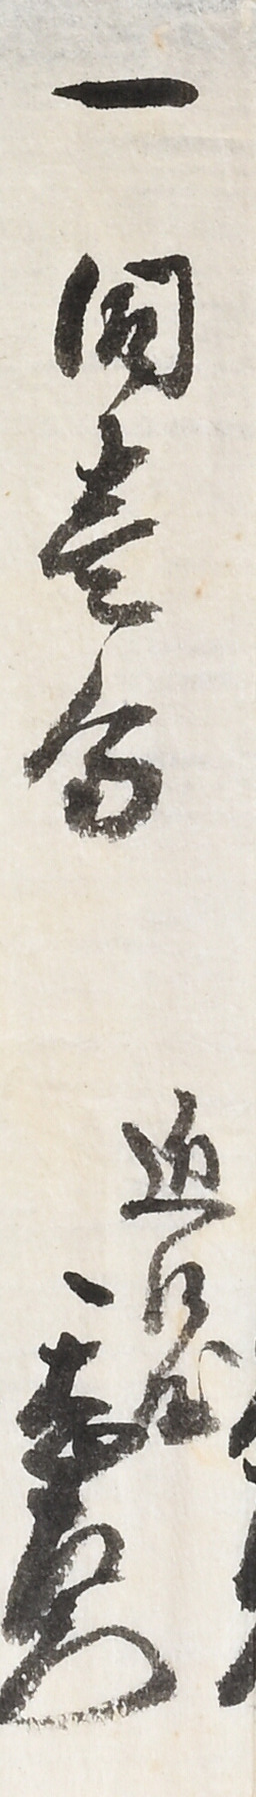一同壱分近江屋甚左衛門
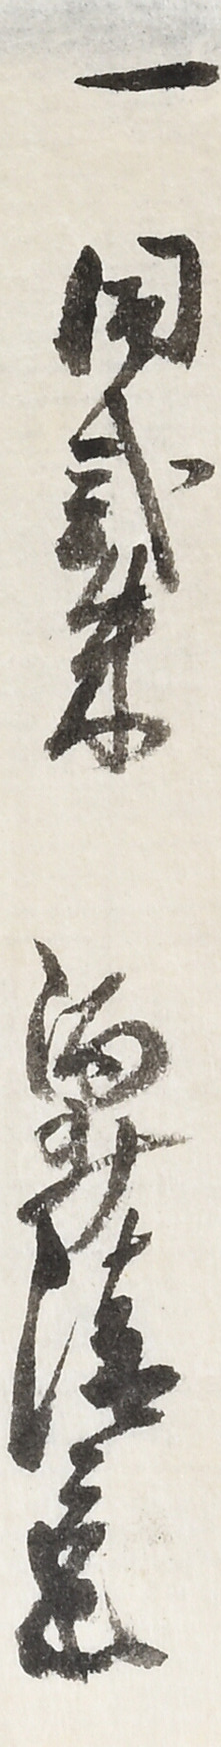一同弐朱酒井清兵衛
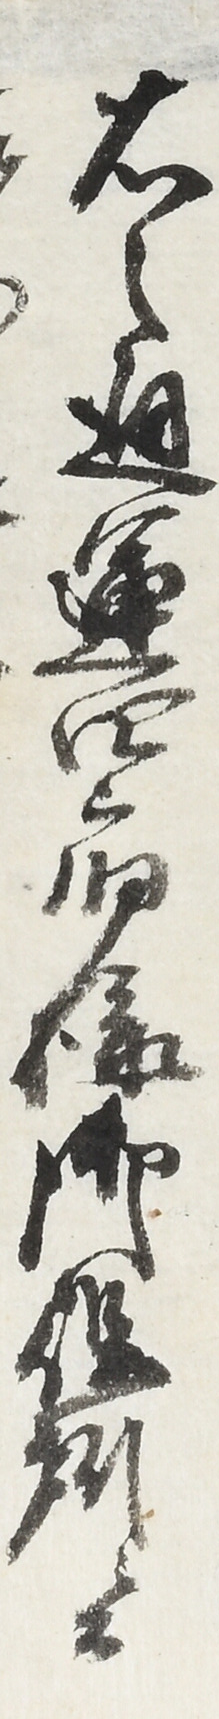右之通運四郎様御役所ニ而
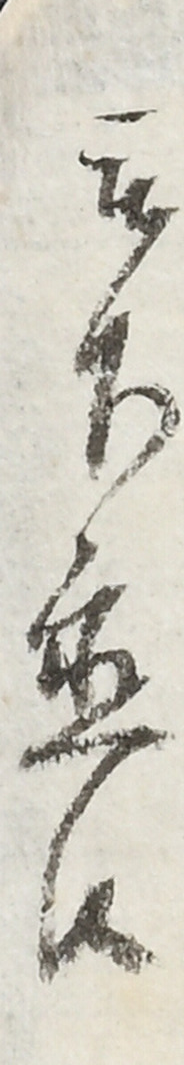被下置候
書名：覚
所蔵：伊那市立高遠町図書館・合同会社AMANE
